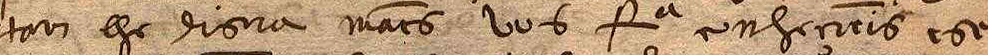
tam lhe disera maes vos fa conheçieis ese
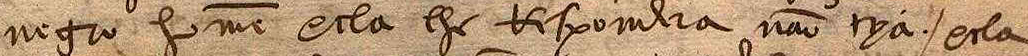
negro homē e ela lhe Respondera não tya ./ e ela
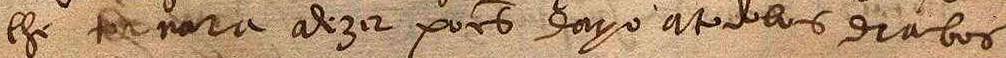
lhe tornara a dizer poes day o a todos diabos
